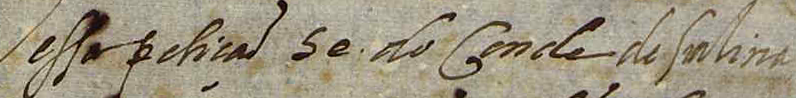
essa petiçaõ he do Conde de Salinas
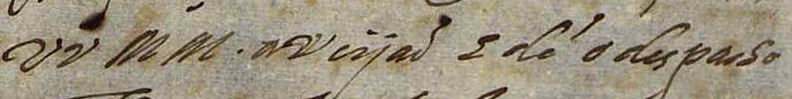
VV MM. a veijaõ E dē o despacho
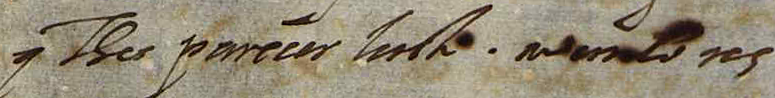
q̄ lhes parecer Iusto. avendo res
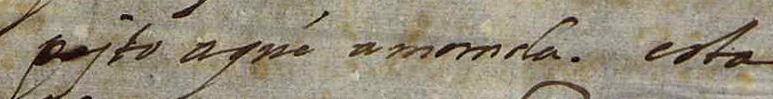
pejto a quē a mamda. esta
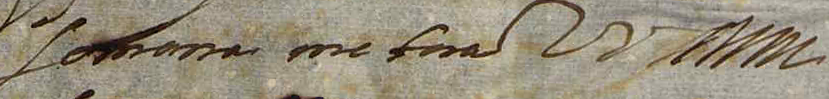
somana me teraõ VV MM
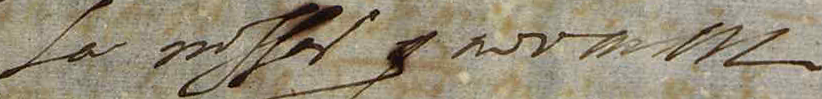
La nossor g a v mM
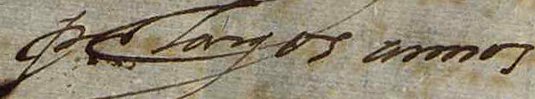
por largos annos
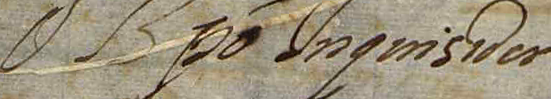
O Bpō Inquisidor
